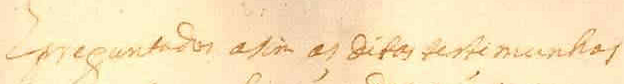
E preguntados asim as ditas testemunhas
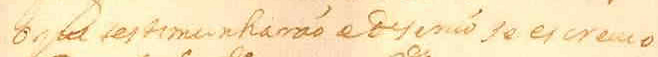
o que testemunharaõ e diseraõ se escreueo
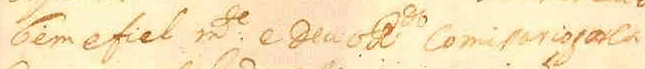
bem e fielm.te e deu o R.do Comissario por ca
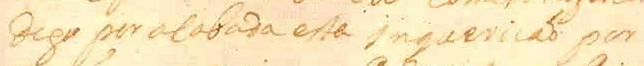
digo por acabada esta inqueriçaõ por
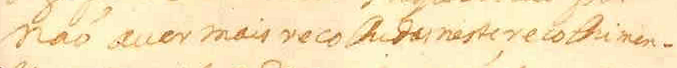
naõ auer mais recolhidas neste recolhimen
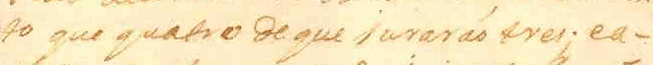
to que quatro de que iuraraõ tres; e a
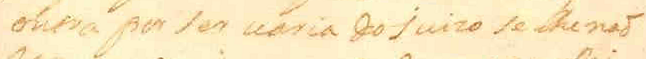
outra por ser uaria do iuizo se lhe naõ
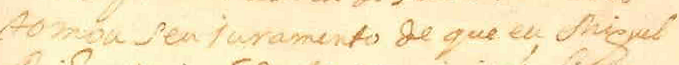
tomou seu iuramento de que eu Miguel
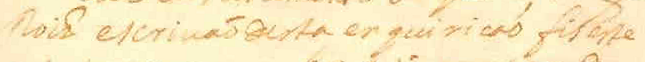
Roiz̄ escriuaõ desta inquiriçaõ fis este
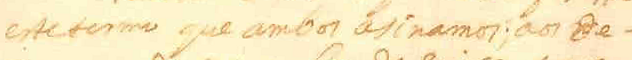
este termo que ambos asinamos; aos de
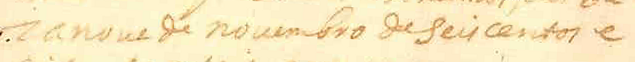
zanoue de nouembro de seiscentos e
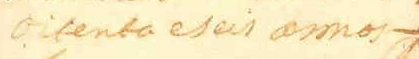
oitenta e seis annos.
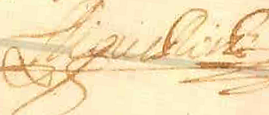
Miguel Roiz̄
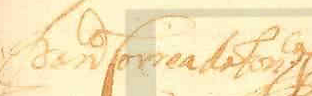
franco Correa da Fonca
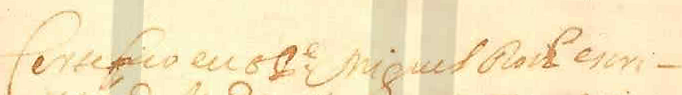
Certefico eu o P.e Miguel Roiz̄ escri
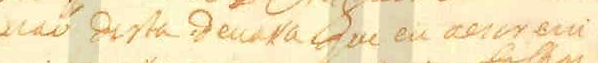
uaõ desta deuassa que eu a escreui
